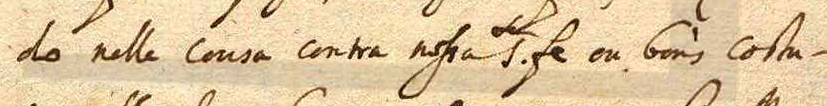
do nelle cousa contra nossa s.ta fe ou bons costu
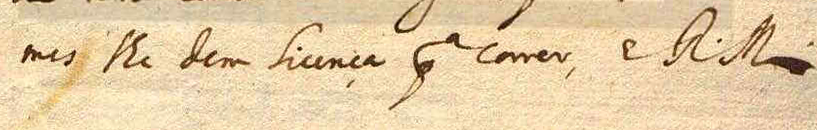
mes lhe dem licença pa correr, e R. M.
